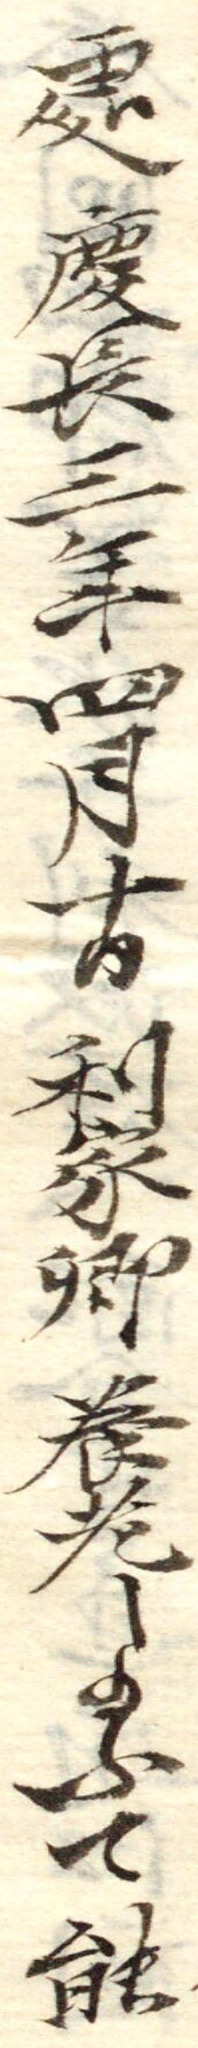處慶長三年四月十日利家卿養老しのふて能

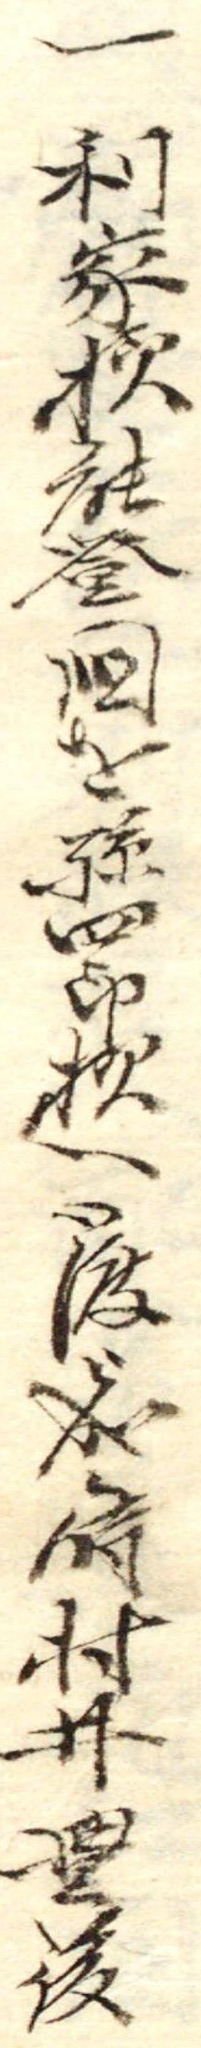一利家様能登国を孫四郎様へ御渡被成候時村井豊後
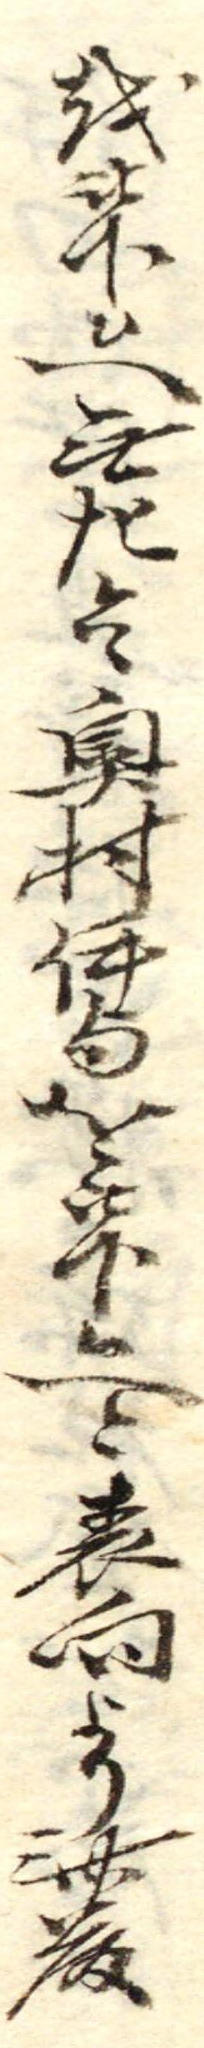越被下候へ無左候て奥村伊衛門を被下候へと表向より斎藤
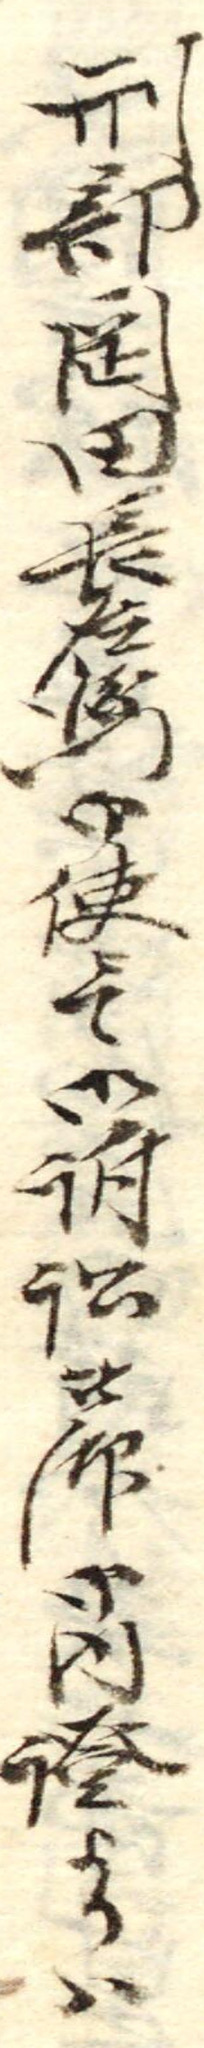刑部岡田長右衛門御使にて御訴訟被仰御内證よりは
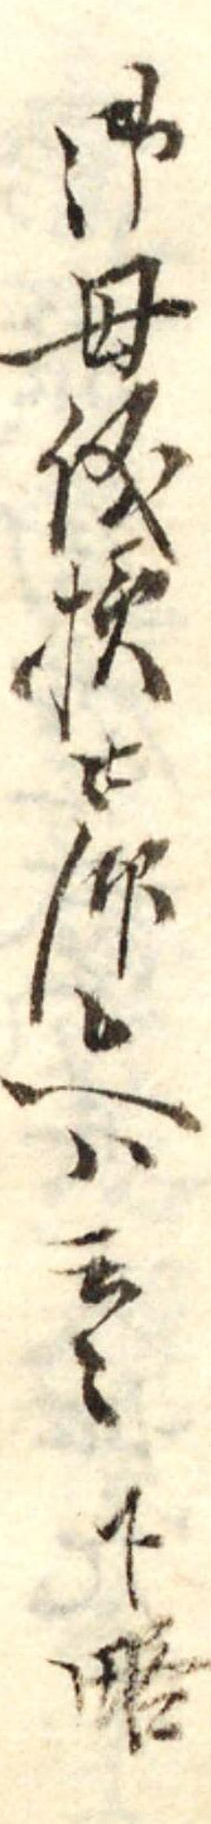御母儀様被仰候へは云々下略
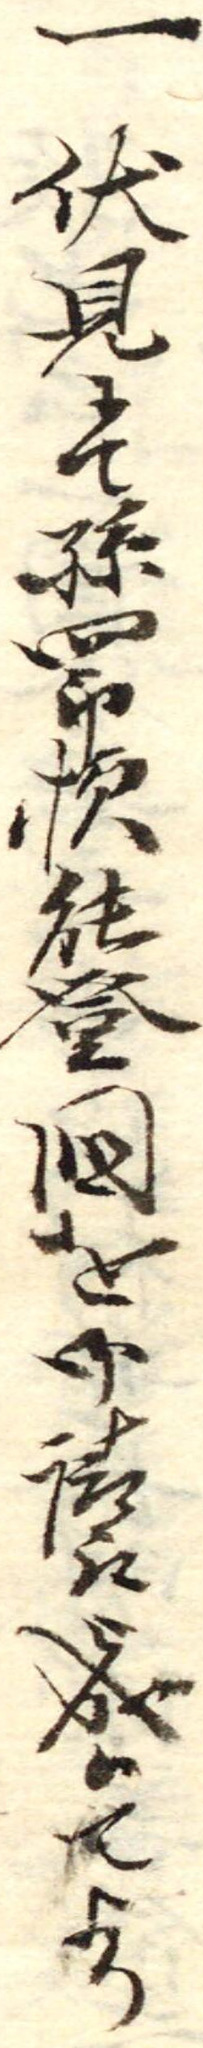一伏見にて孫四郎様能登国を御請取被成候てより
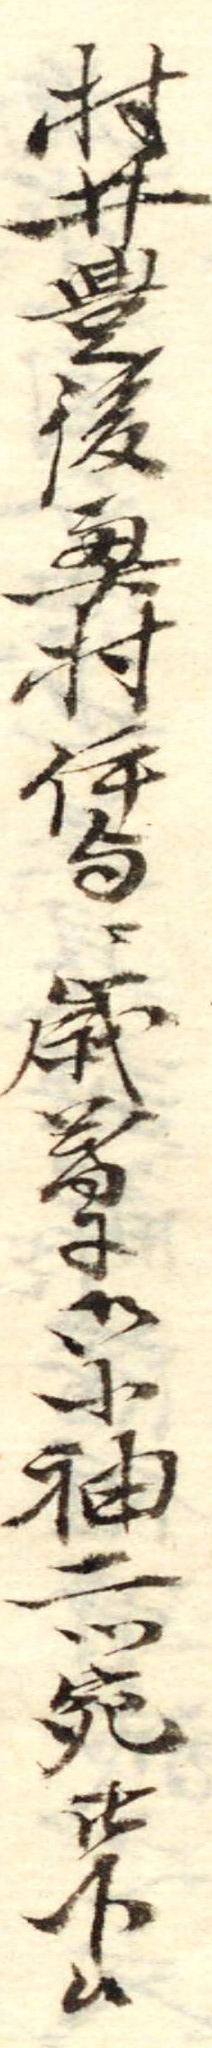村井豊後奥村伊衛門に歳暮尓御小袖二つ宛被下候
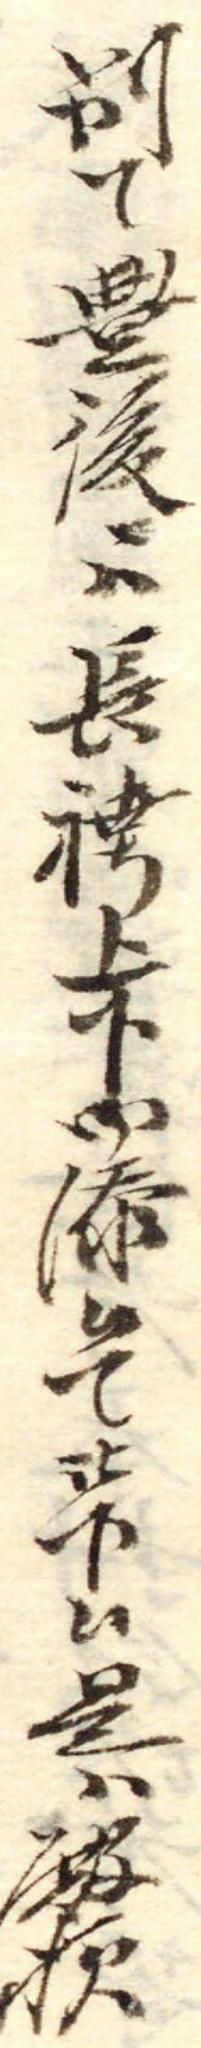別て豊後には長袴上下御添候て被下候是は殿様
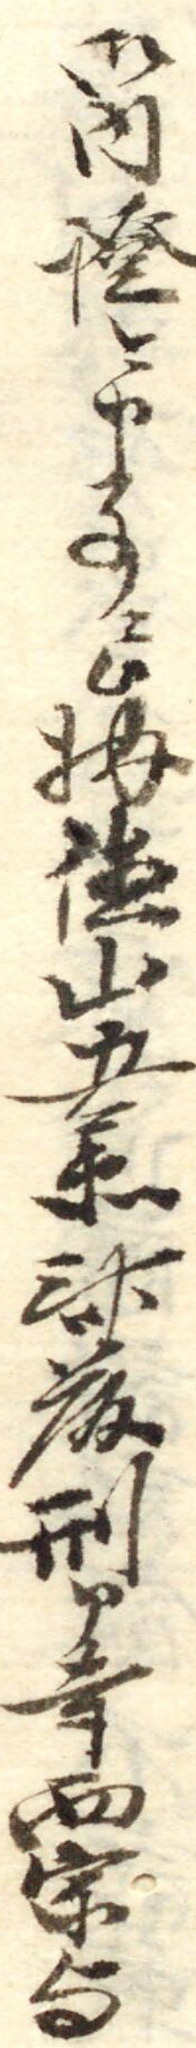御内證と申事に候扨徳山五兵衛斎藤刑部寺西宗衛門
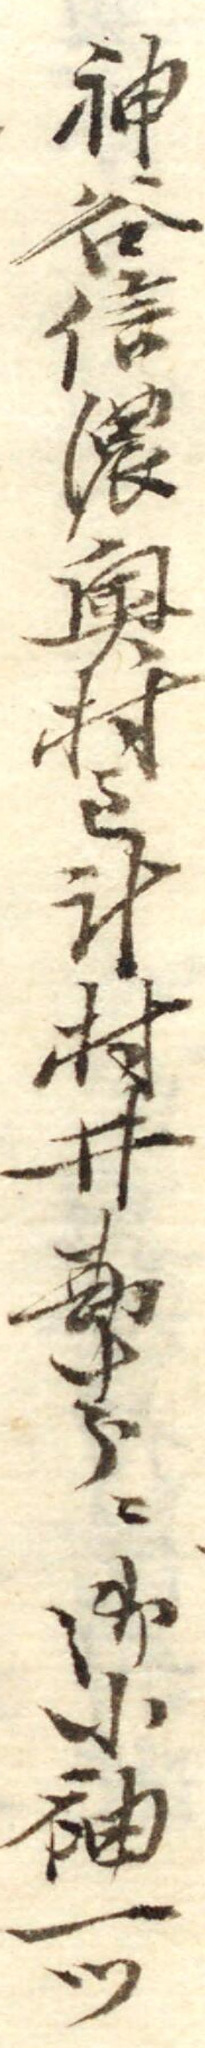神谷信濃奥村主計村井勘十郎に御小袖一つ
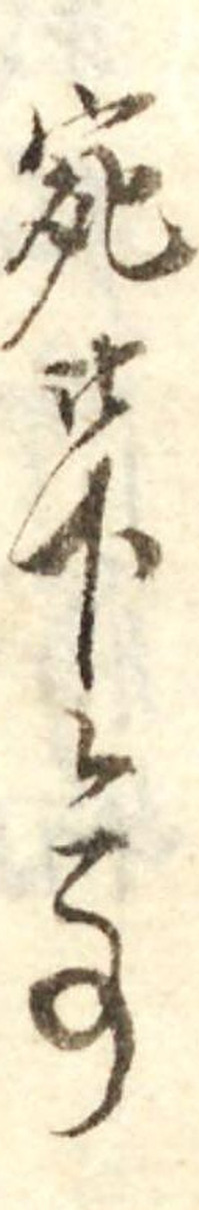宛被下候事
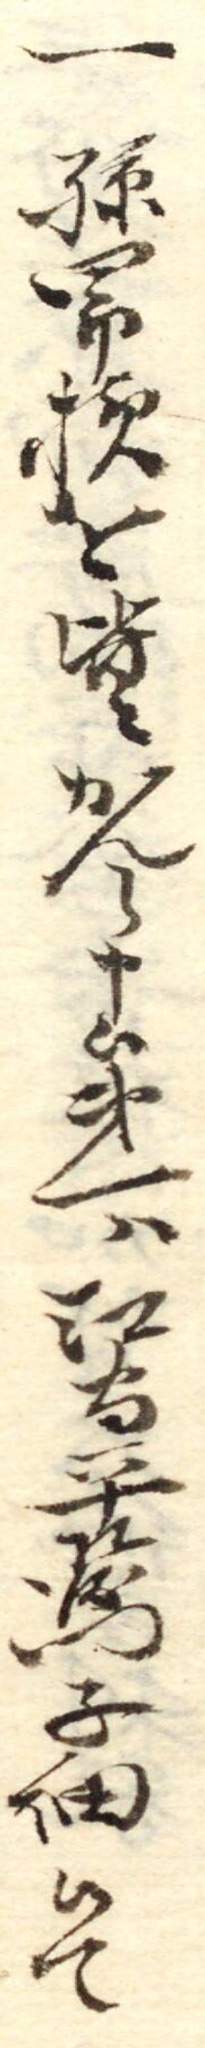一孫四郎様を皆かんし申候第一は江守平左衛門子細候て
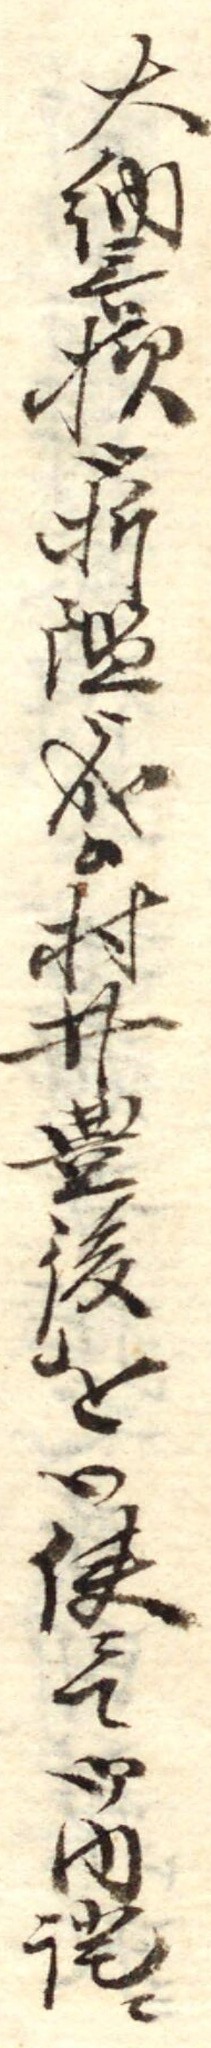大納言様御折鑑被成候村井豊後を御使にて御内證に
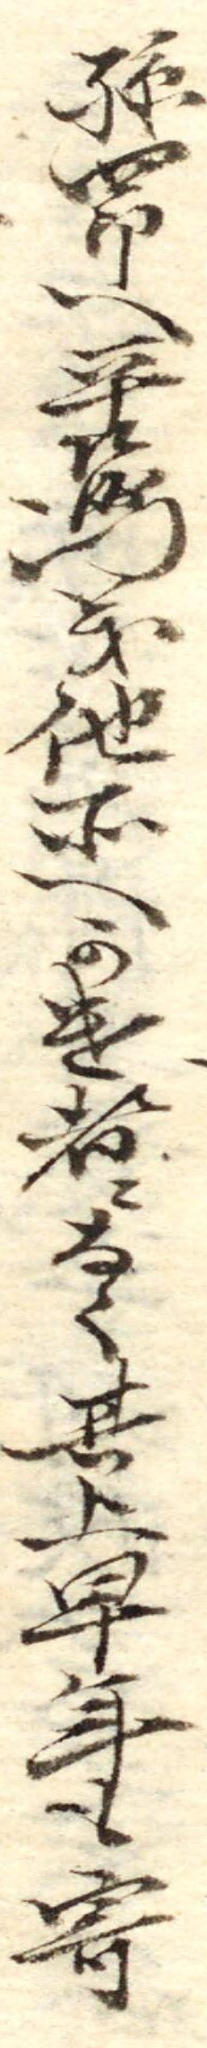孫四郎へ平左衛門儀他所へ可遣者になく其上早年も寄
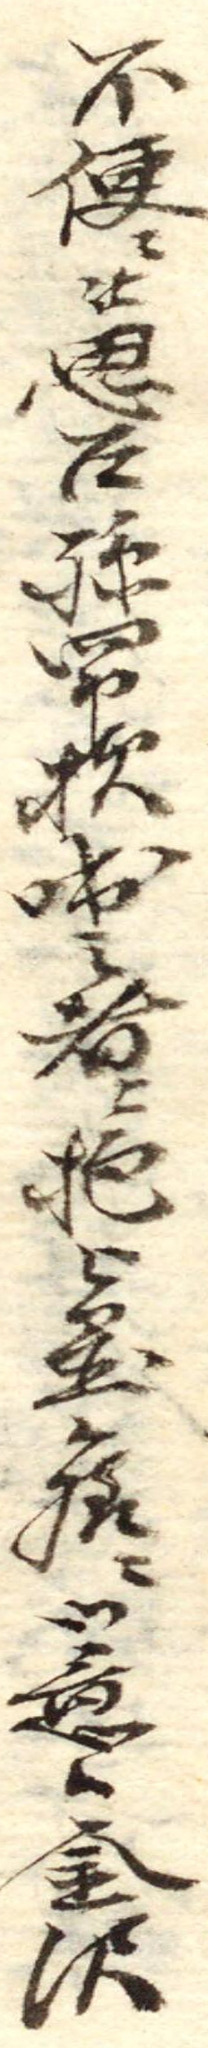不便に被思召孫四郎様咄之者に抱被置候様に御意候金沢
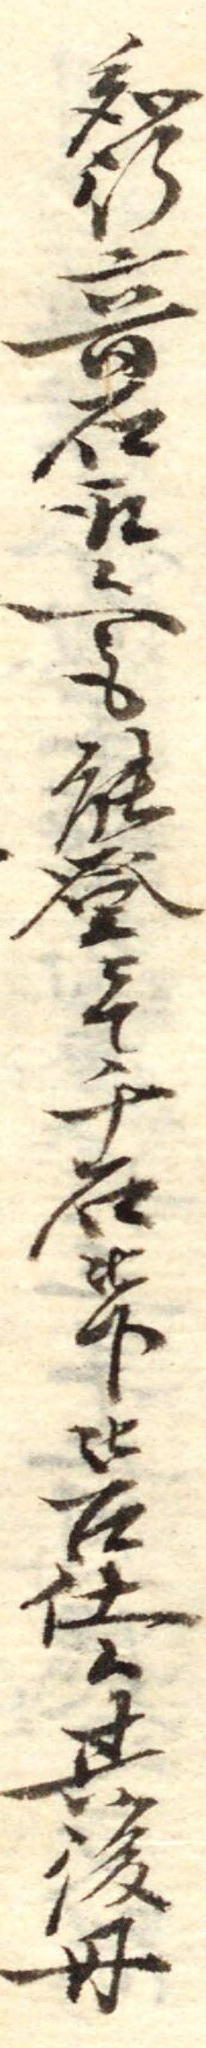知行六百石取候へとも能登にて千石被下被召仕候其後丹
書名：前田家封国証書集録
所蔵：Ishikawa Prefectural Library
